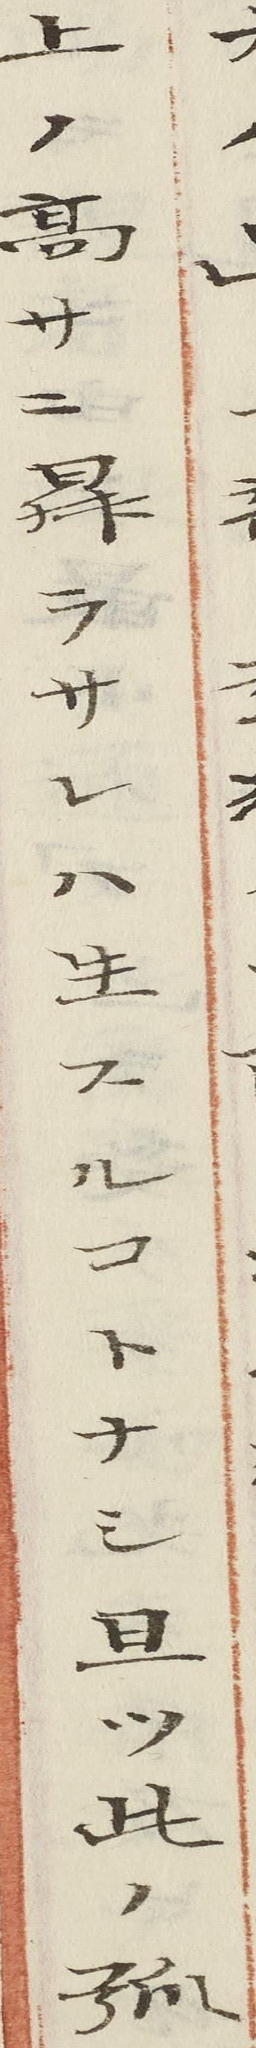上ノ高サニ昇ラサレハ生スルコトナシ且ツ此ノ弧
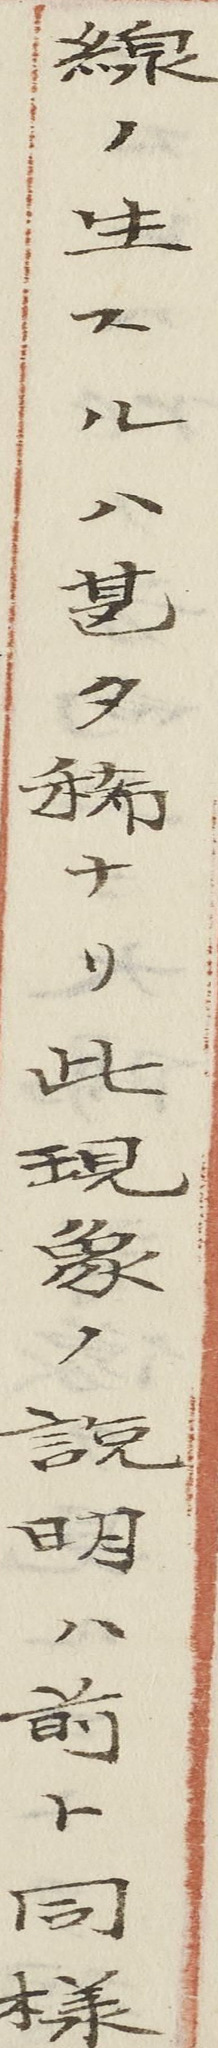線ノ生スルハ甚タ稀ナリ此現象ノ説明ハ前ト同様
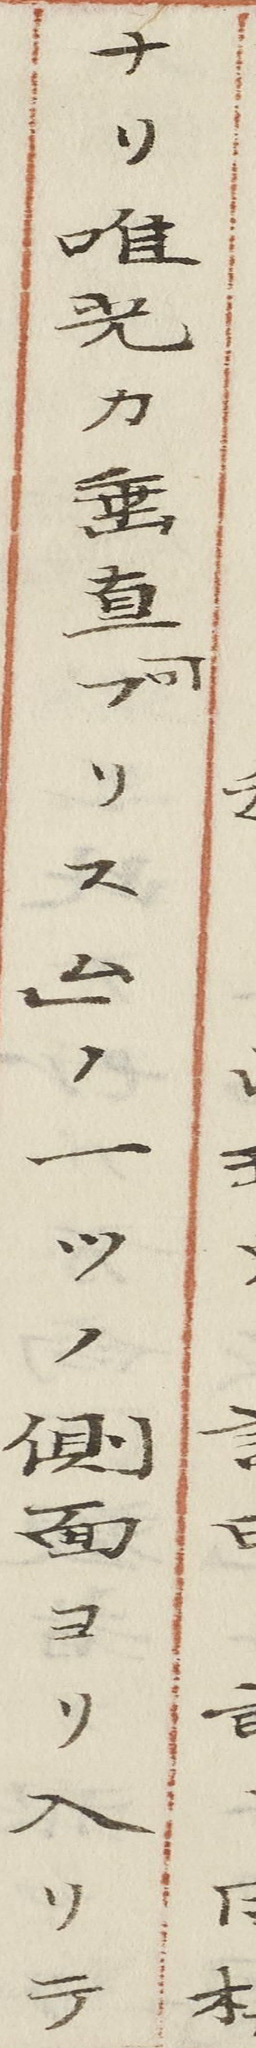ナリ唯光カ垂直「プリスム」ノ一ツノ側面ヨリ入リテ
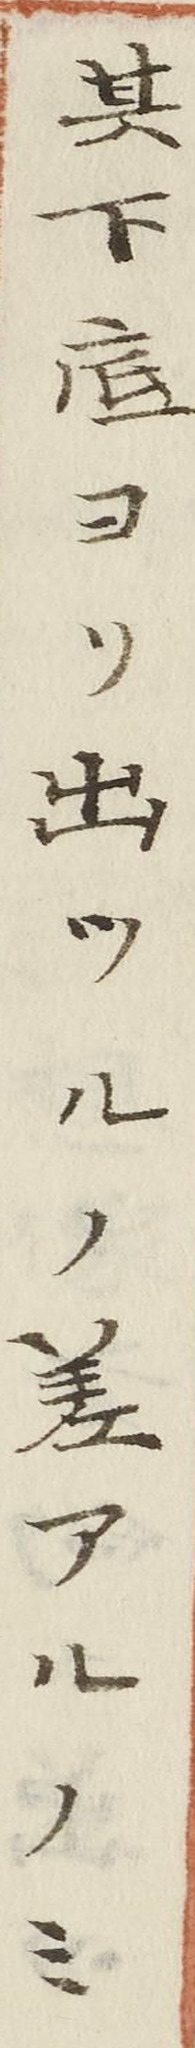其下底ヨリ出ツルノ差アルノミ
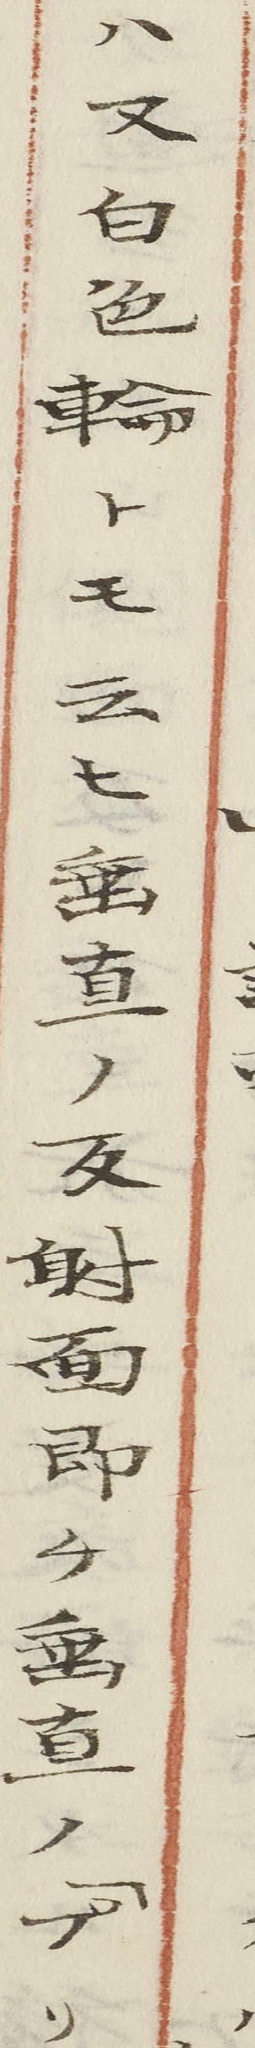ハ又白色輪トモ云ヒ垂直ノ反射面即チ垂直ノ「プリ
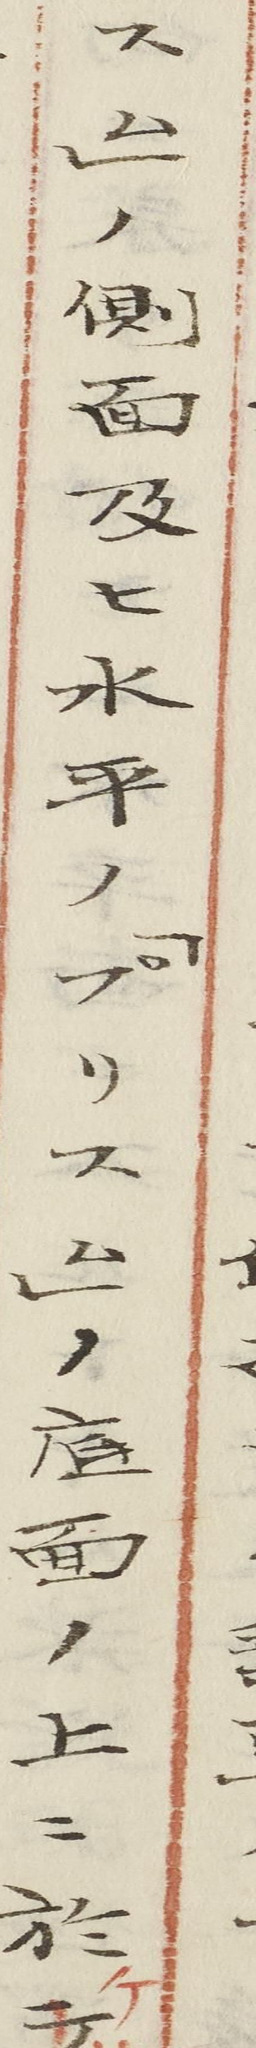スム」ノ側面及ヒ水平ノ「プリスム」ノ底面ノ上ニ於ケル
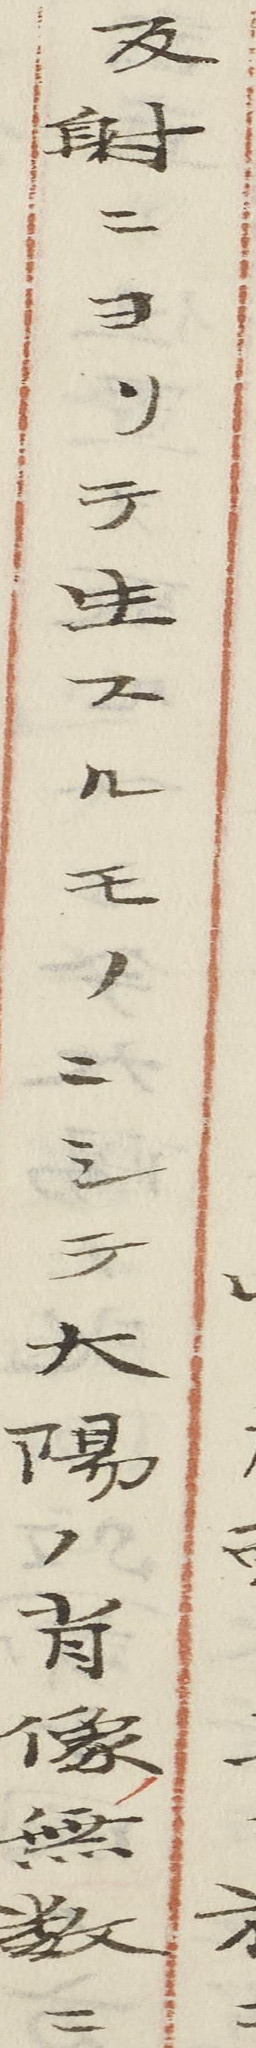反射ニヨリテ生スルモノニシテ大陽ノ肖像ノ無数ニ
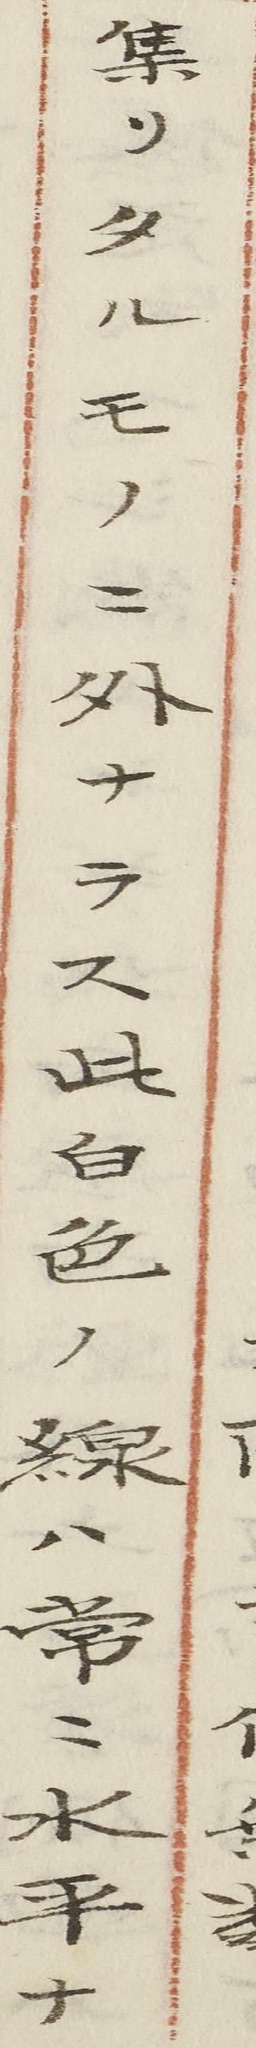集リタルモノニ外ナラス此白色ノ線ハ常ニ水平ナ
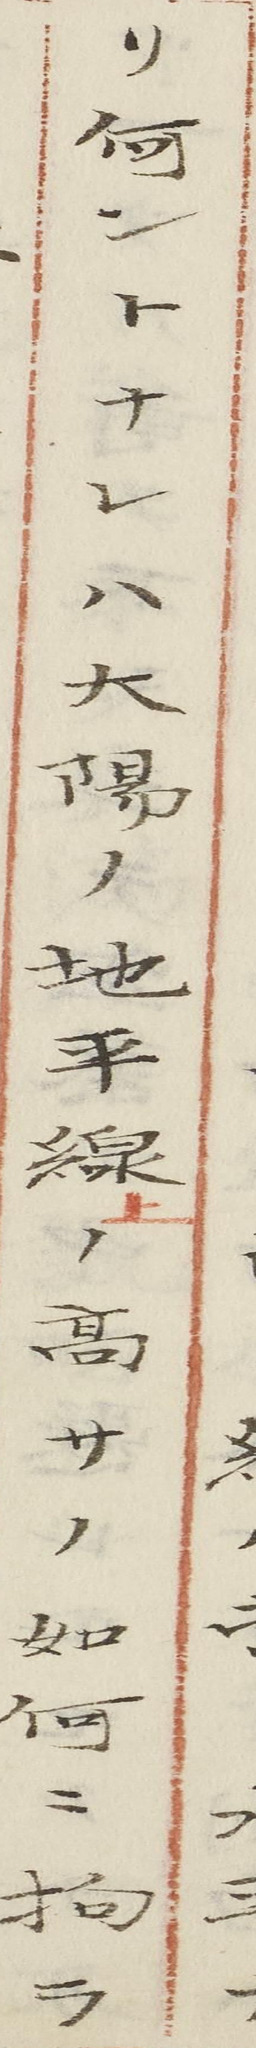リ何ントナレハ大陽ノ地平線上ノ高サノ如何ニ拘ラ
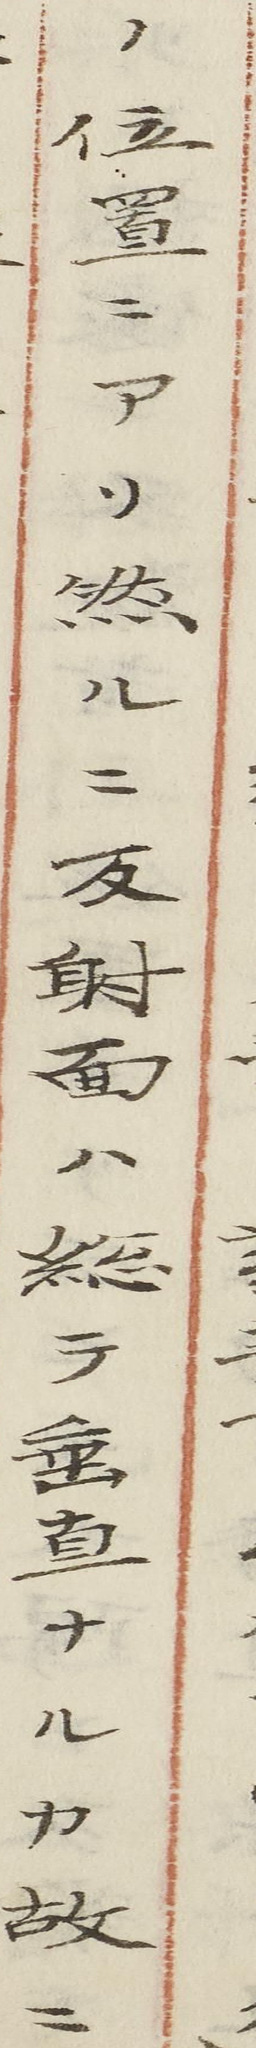ノ位置ニアリ然ルニ反射面ハ総テ垂直ナルカ故ニ
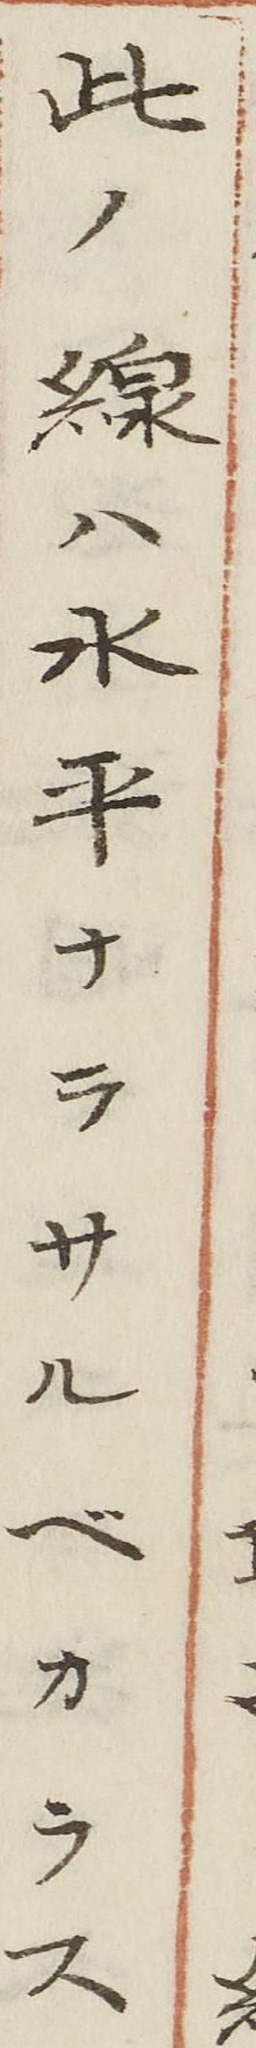此ノ線ハ水平ナラサルベカラス
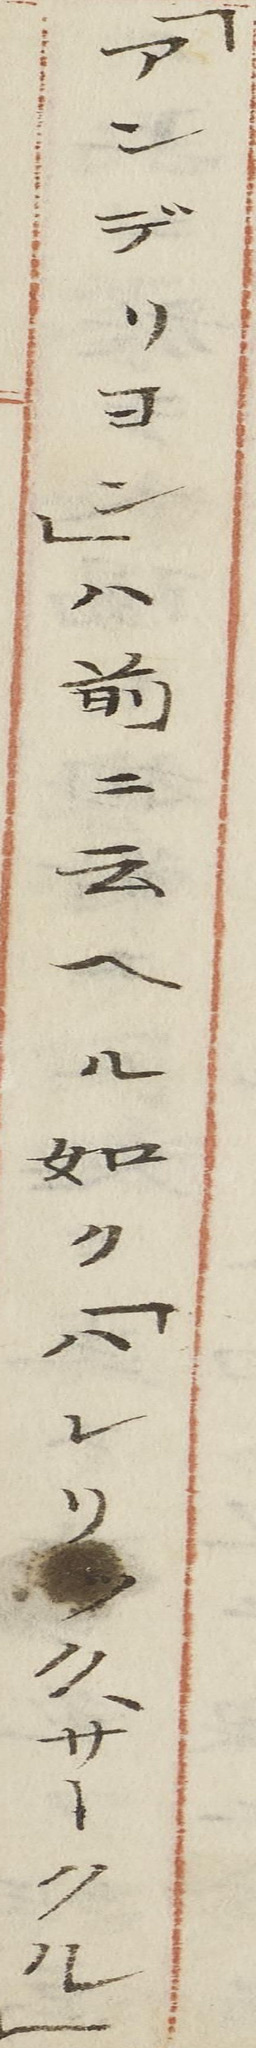「アンデリヨン」ハ前ニ云ヘル如ク「ハレリック、サークル」

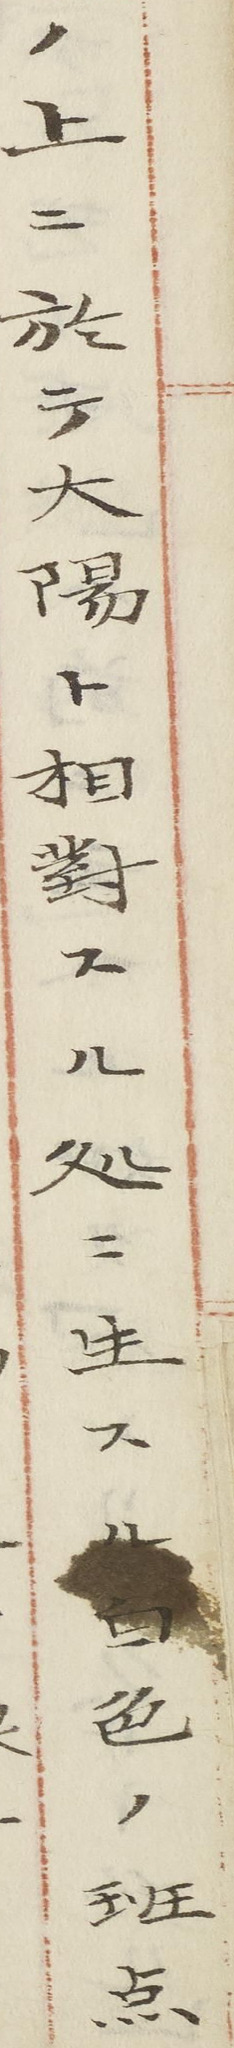ノ上ニ於テ大陽ト相対スル処ニ生スル白色ノ斑点
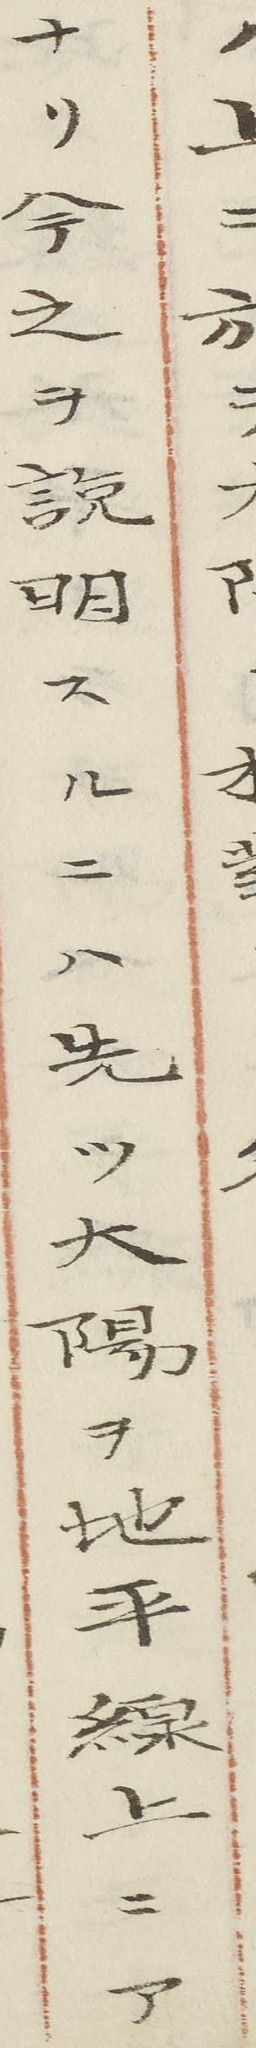ナリ今之ヲ説明スルニハ先ツ大陽ヲ地平線上ニア
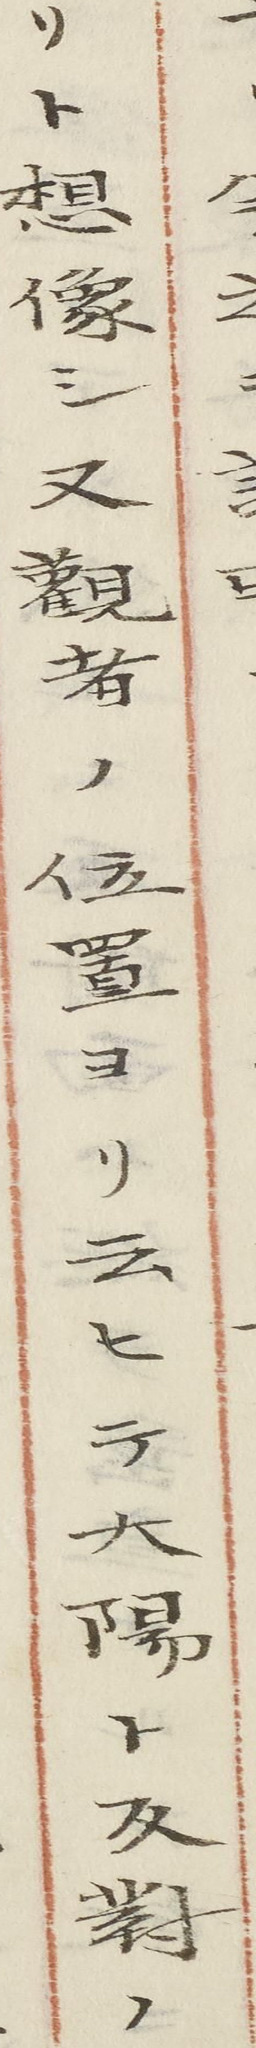リト想像シ又観者ノ位置ヨリ云ヒテ大陽ト反対ノ
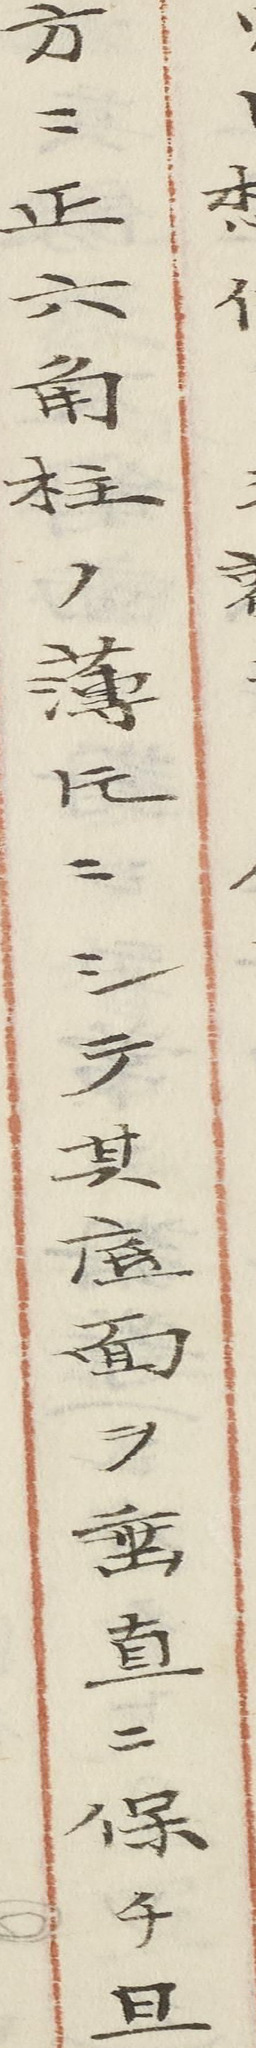方ニ正六角柱ノ薄片ニシテ其底面ヲ垂直ニ保チ旦
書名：虹及ハロノ説明
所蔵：東京大学地震研究所図書室 Earthquake Research Institute Library, The University of Tokyo, JAPAN
